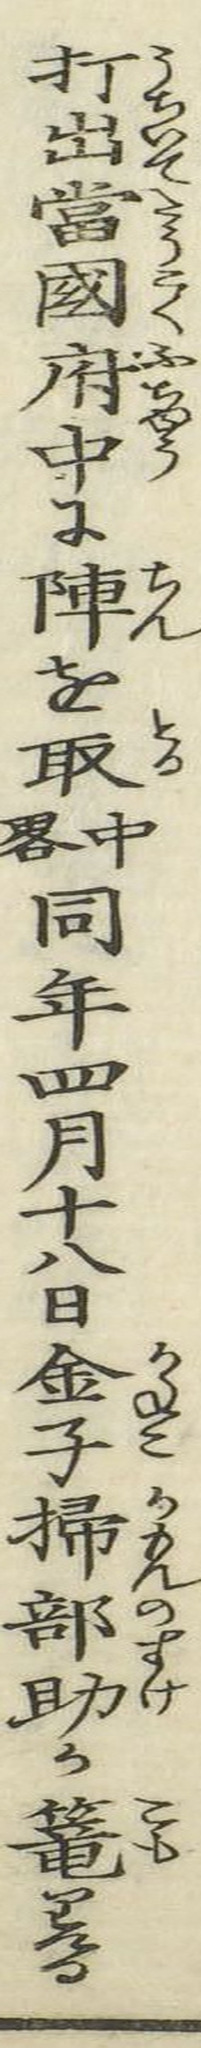打出当国府中に陣を取中略同年四月十八日金子掃部助か籠りける
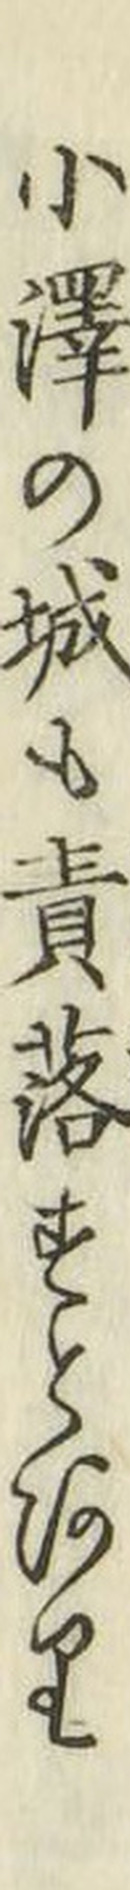小沢の城も責落すとあり
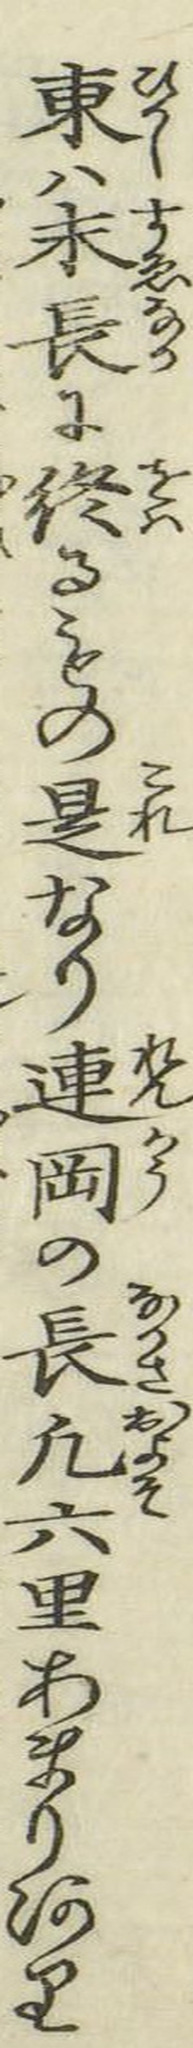東は末長に終るもの是なり連岡の長凡六里あまりあり

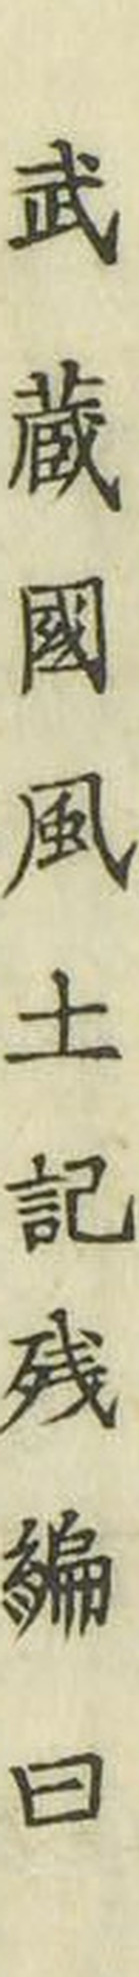武蔵国風土記残編曰
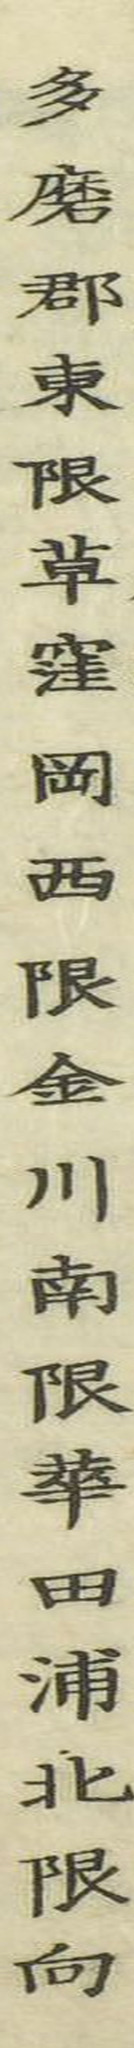多磨郡東限草窪岡西限金川南限華田浦北限向
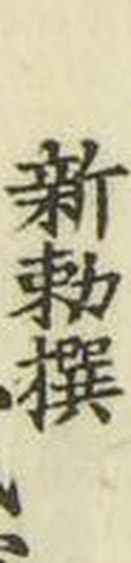新勅撰
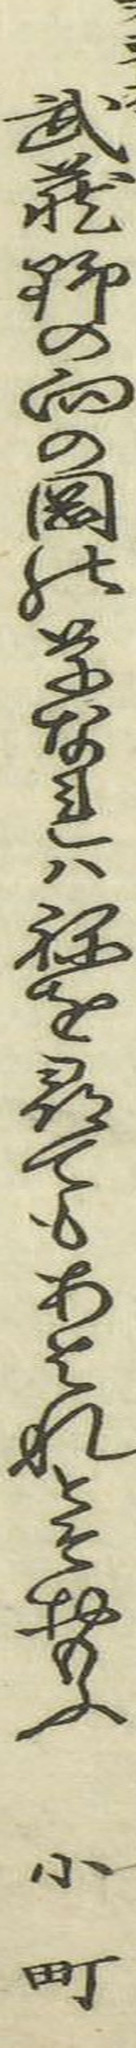武蔵野の向の岡の草なれはねを尋てもあはれとそおもふ小町
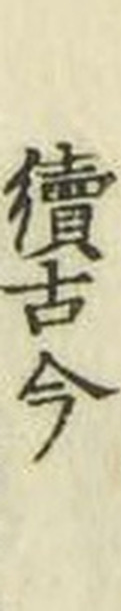続古今
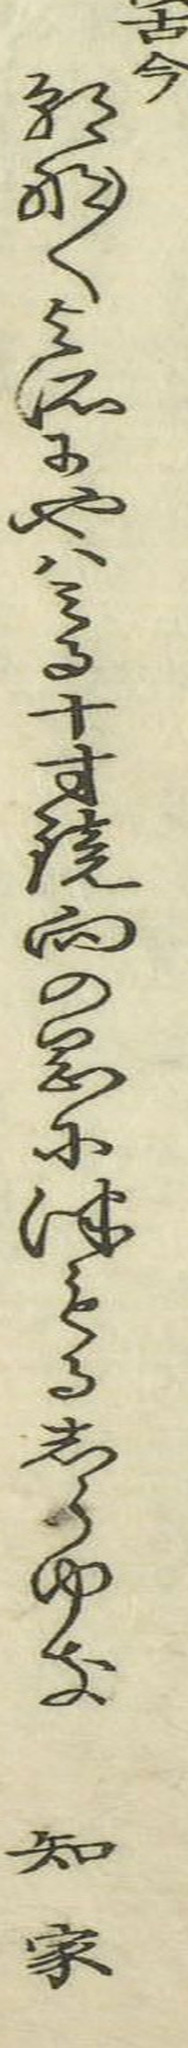朝な〳〵よそにやはみる十寸鏡向の岡につもるしらゆき知家
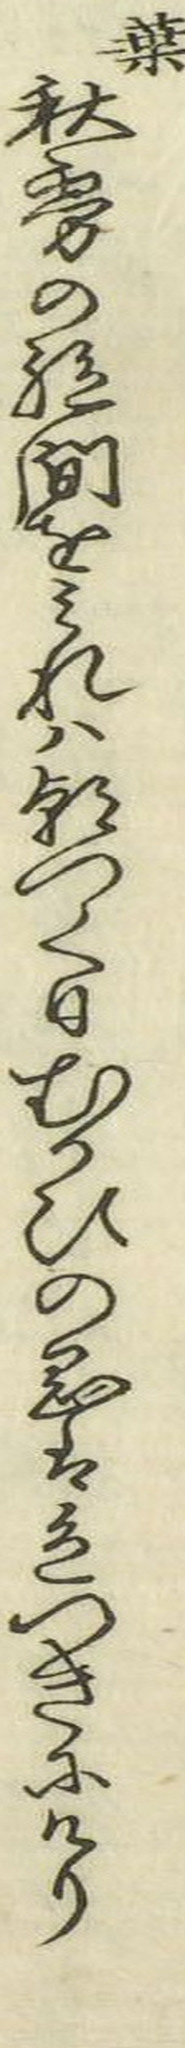秋霧の絶間をみれは朝つく日むかひの岡は色つきにけり後一条
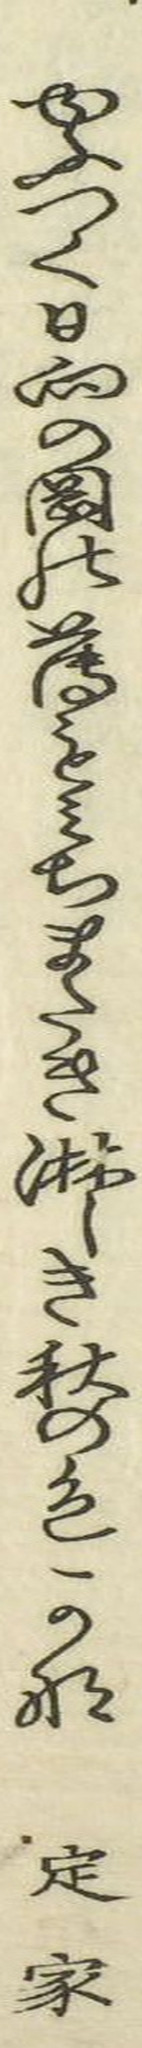ゆふつく日向の岡の薄もみちまたき淋しき秋の色かな定家
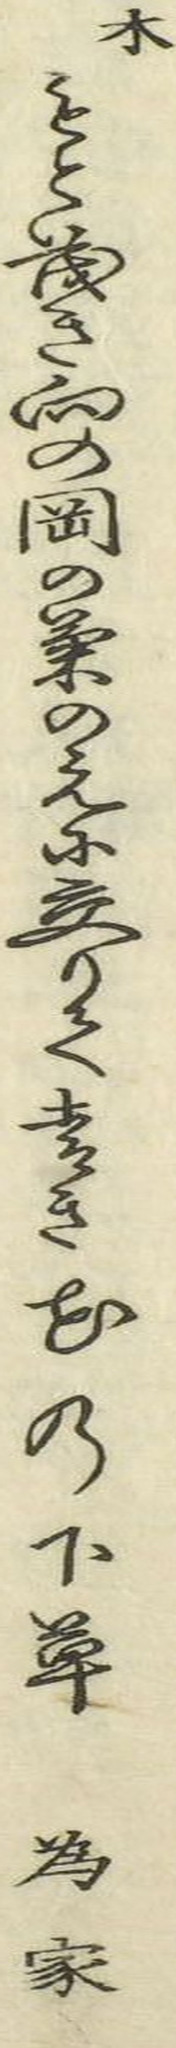もと茂き向の岡の菊のえに交りて青き花の下草為家
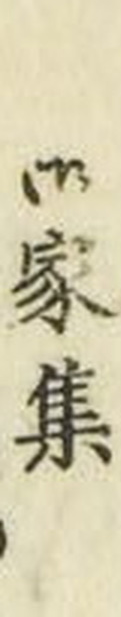御家集
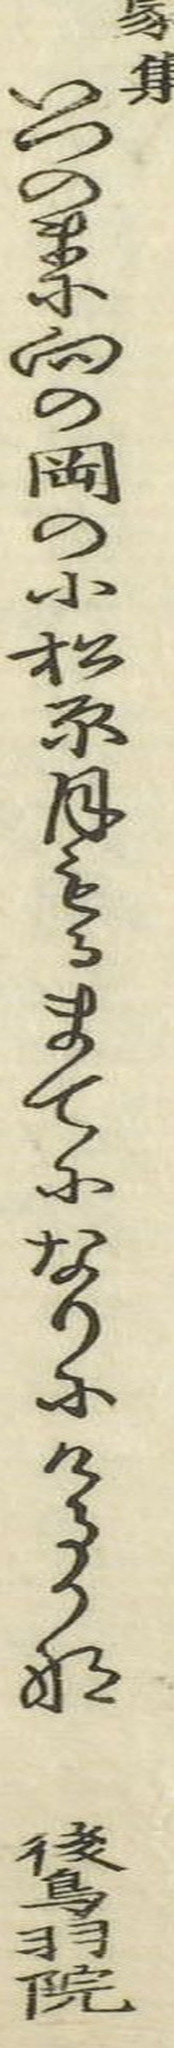いつのまに向の岡の小松原月もるまてになりにけるかな後鳥羽院
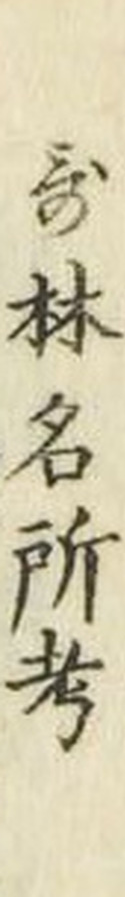哥林名所考
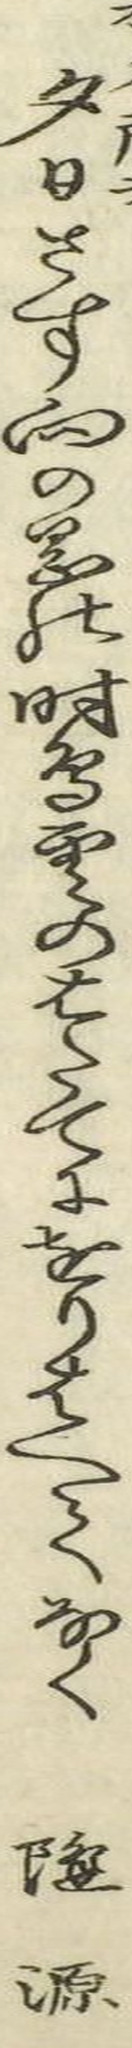夕日さす向の岡の時鳥雲のはたてにをりはへてなく隆源
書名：江戸名所図会 20巻 巻之10
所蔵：東京学芸大学教育コンテンツアーカイブ
